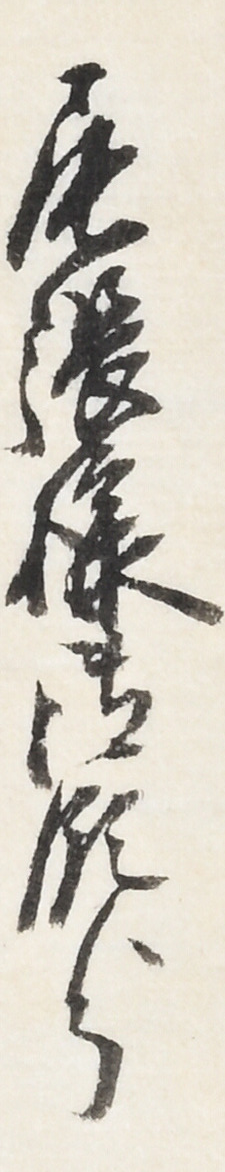尾張様御領分
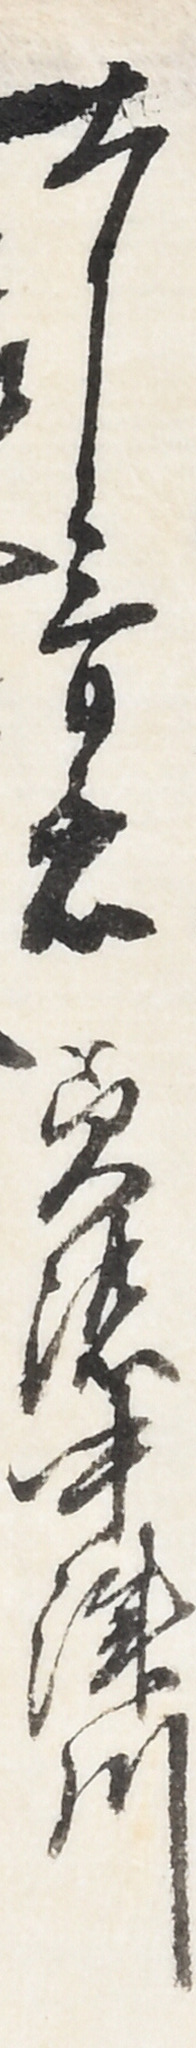十一月三日着美濃中津川
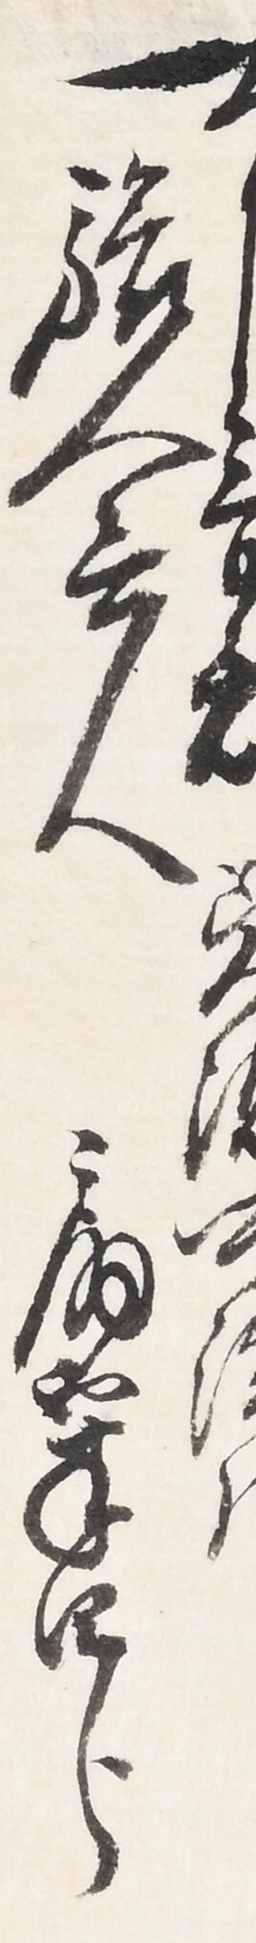一旅人壱人扇や半四郎
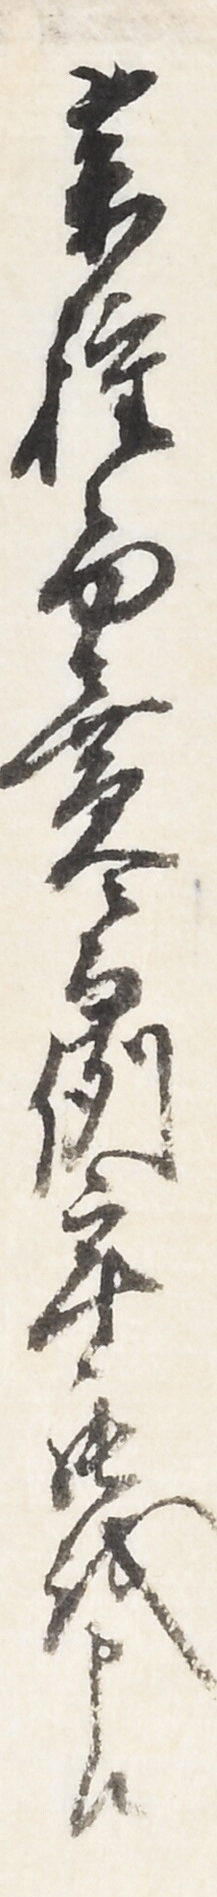薬種商売ニ而例年罷越申候
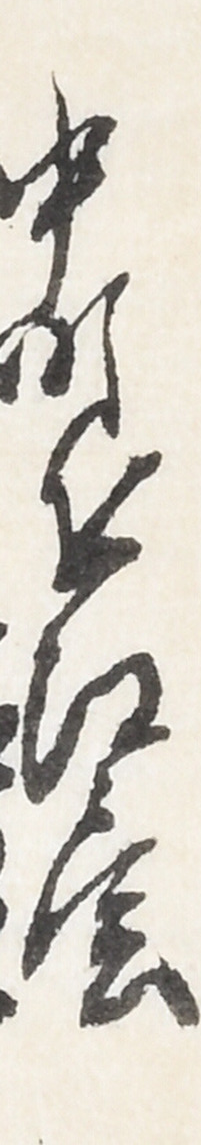中町近江屋
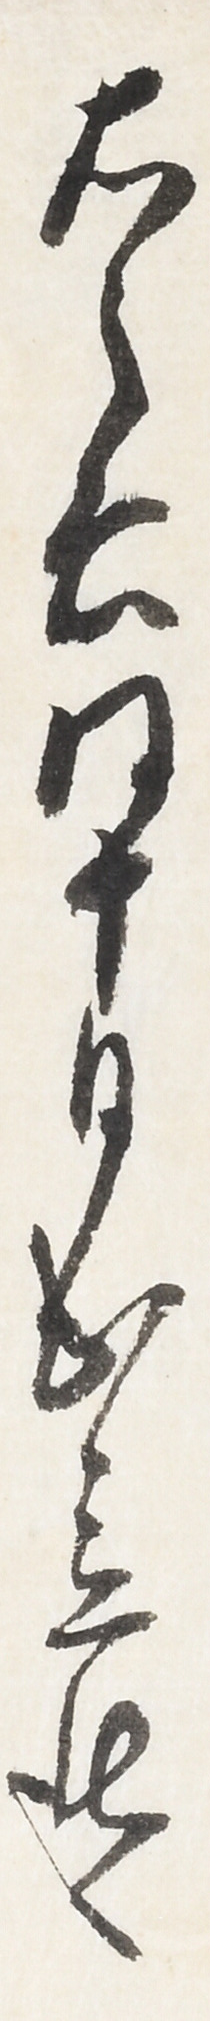右之者同十日出立仕候
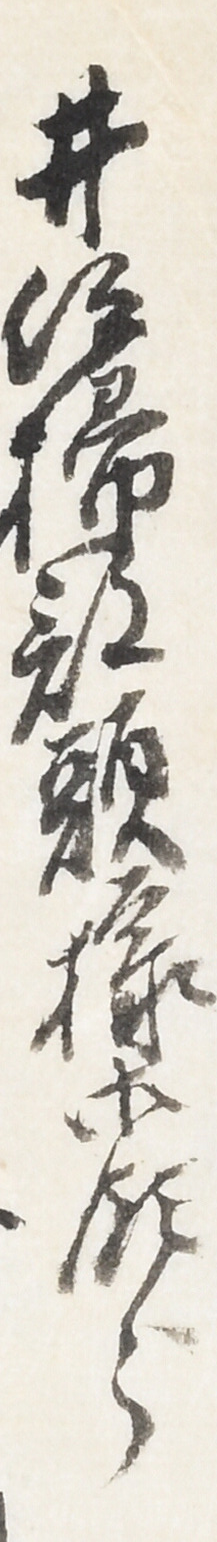井伊掃部頭様御領分
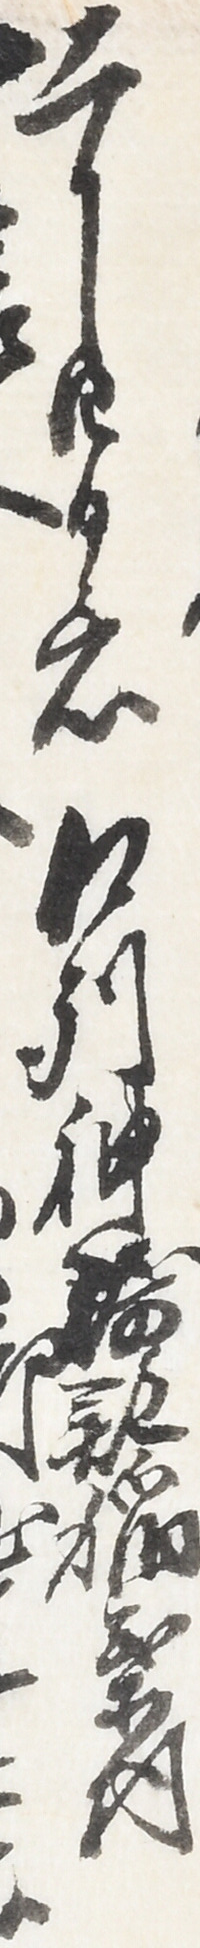十一月四日着江州神崎郡稲葉村
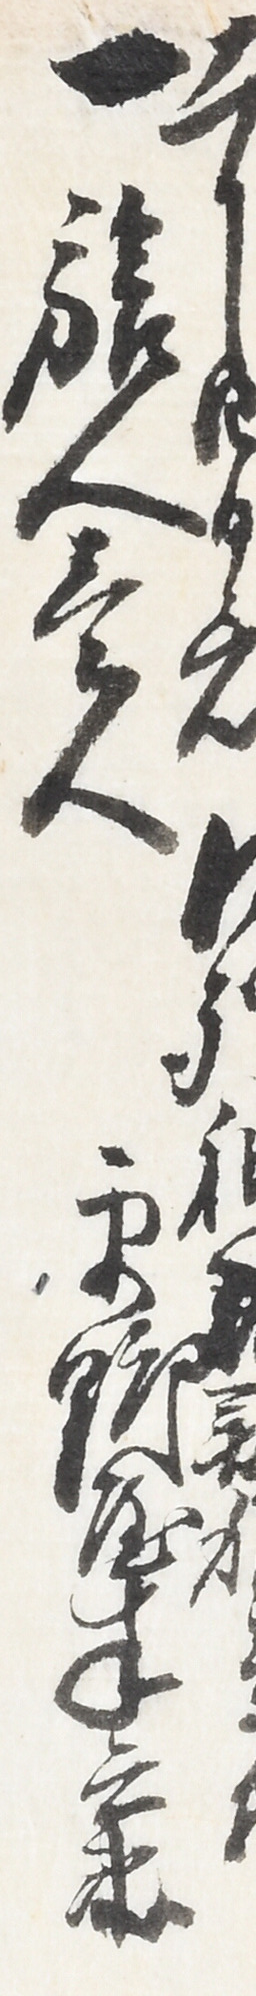一旅人壱人平野屋半兵衛
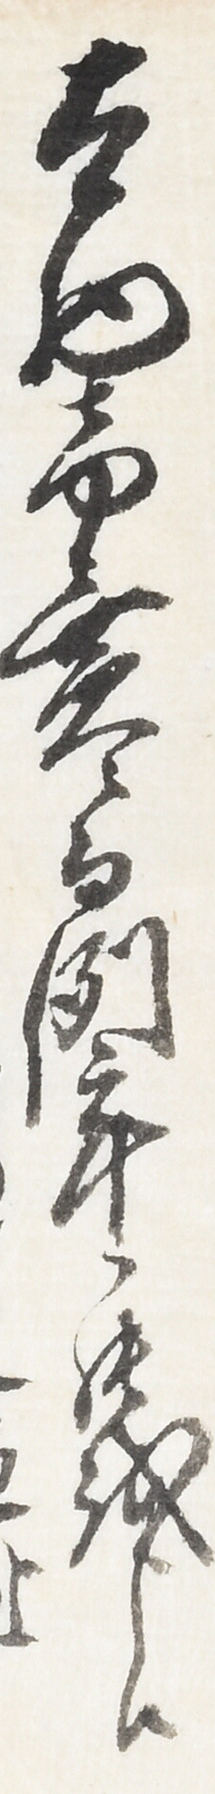太物商売ニ而例年罷越申候
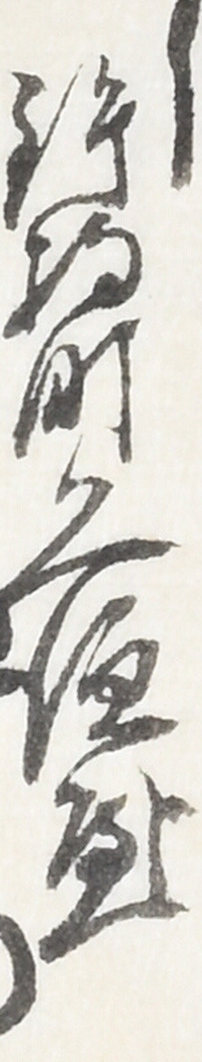鉾持町久住屋
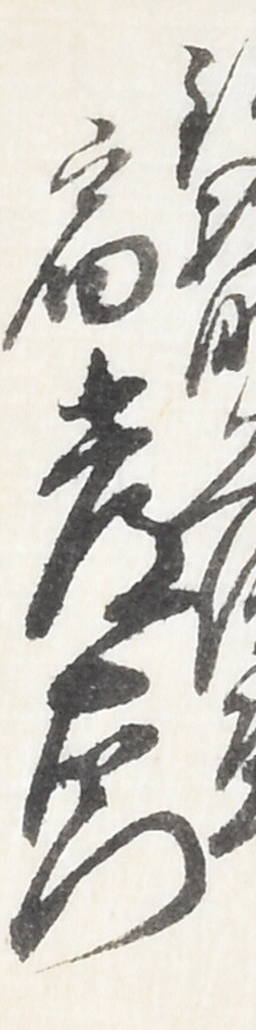宿常右衛門
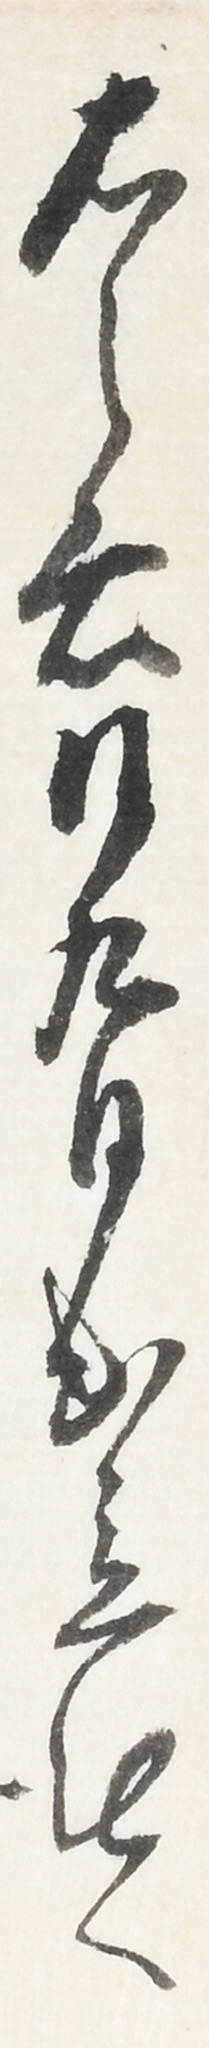右之者同九日出立仕候
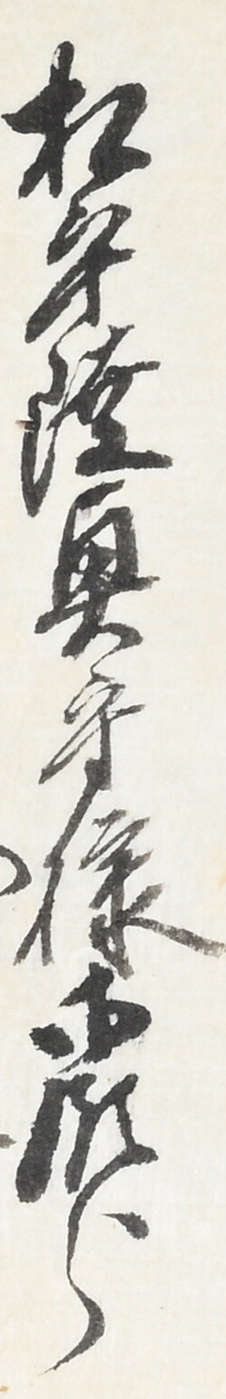松平陸奥守様御領分
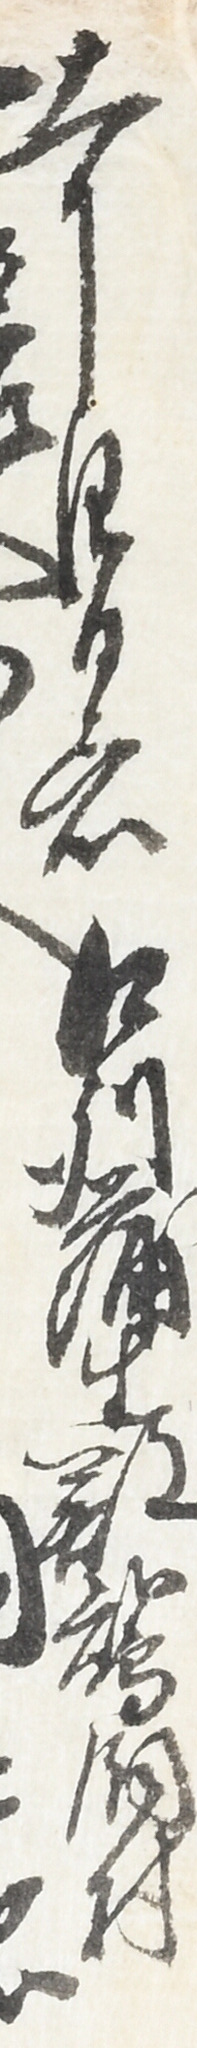十一月四日着江州蒲生郡鷹飼村
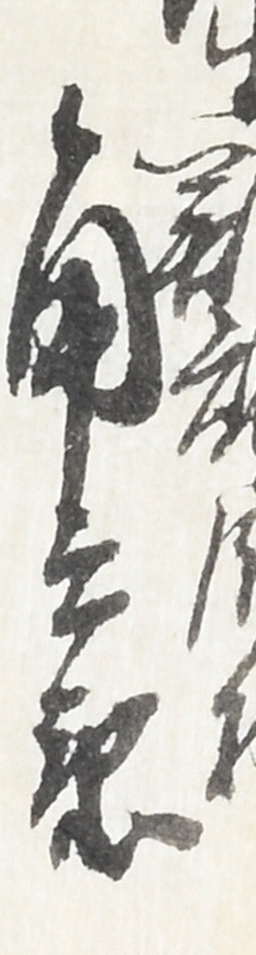清兵衛
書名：旅人泊控帳
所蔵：伊那市立高遠町図書館・合同会社AMANE
